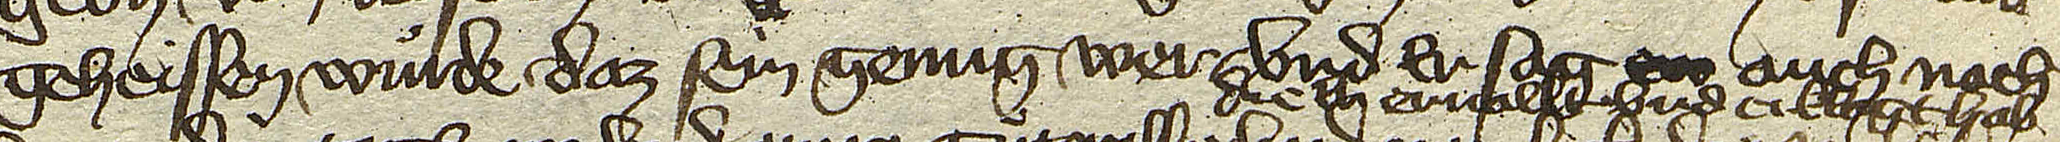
geheiſſen würde / daʒ ſein genug wer / vnd Er ſag ew auch noch
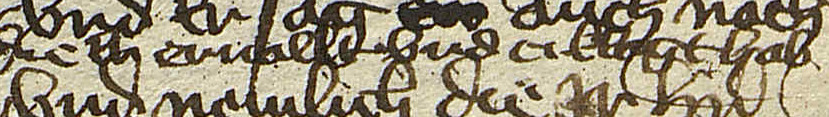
die Er eruollt vnd erklagt hab
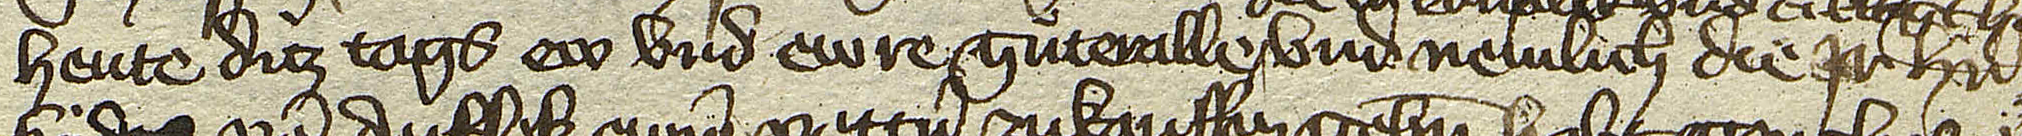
heute dicʒ tags ew vnd ewre güter alle vnd nemlich die Ir hn*
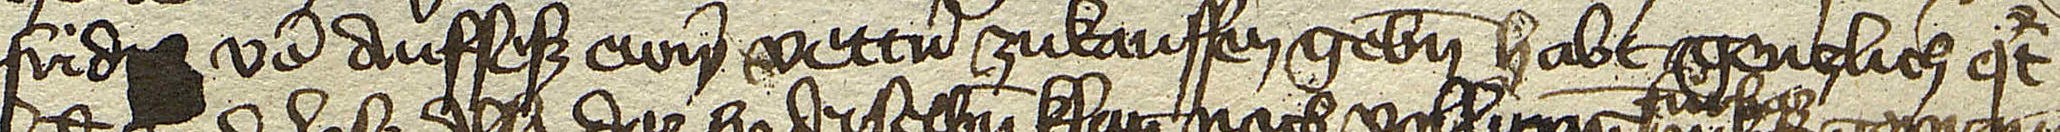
frid* vo* Aufſeſʒ ewn* vettn* cʒukauffen gebn* habt gencʒlich iſt
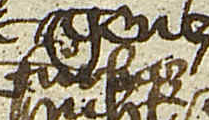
fürbaʒ
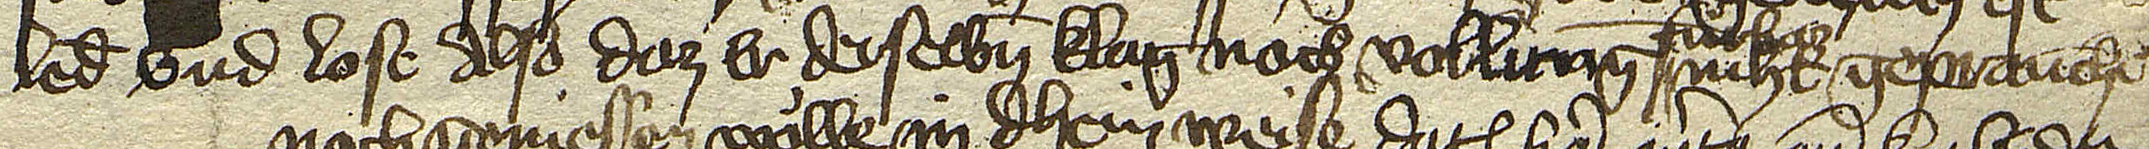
led* vnd loſe Alſo daʒ Er derſelbn* klag noch vollung* niht geprauche*
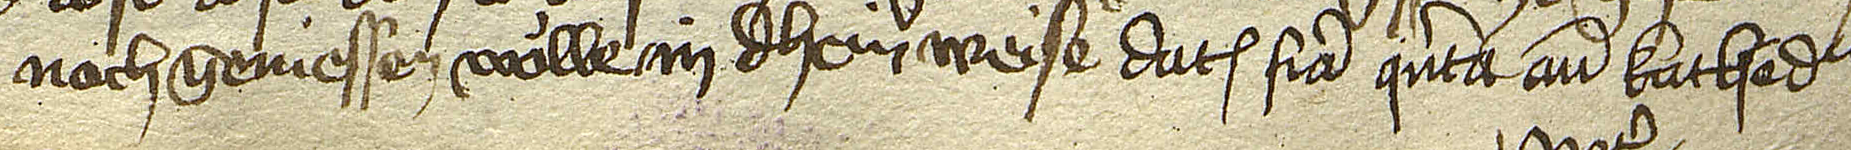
noch genieſſen wölle / in dhein weiſe dat* fia* quta* an* kathed*
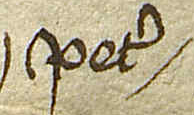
pet* /
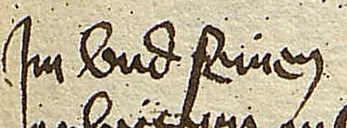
Im vnd ſeinen
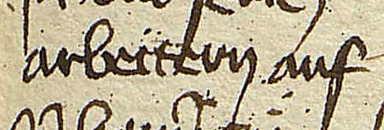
arbeitern auf
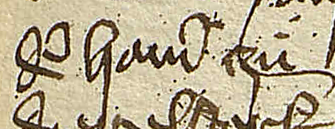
d* ham* cʒü
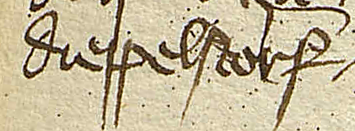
dieppelſtorf
